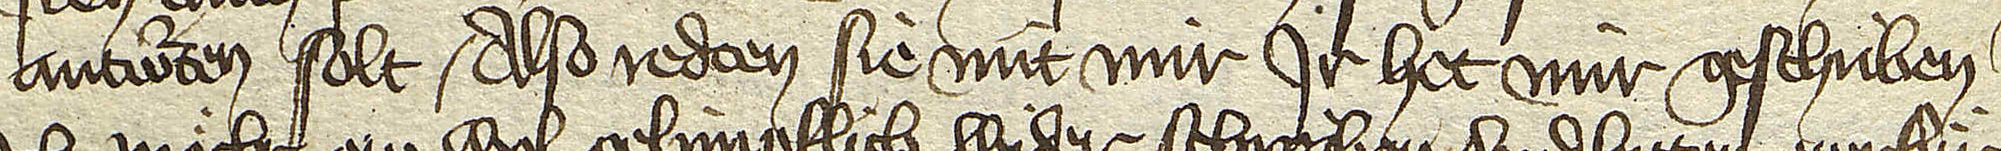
antwt*en ſolt / Alſo redten ſie mir mit Ir het mir geſchriben
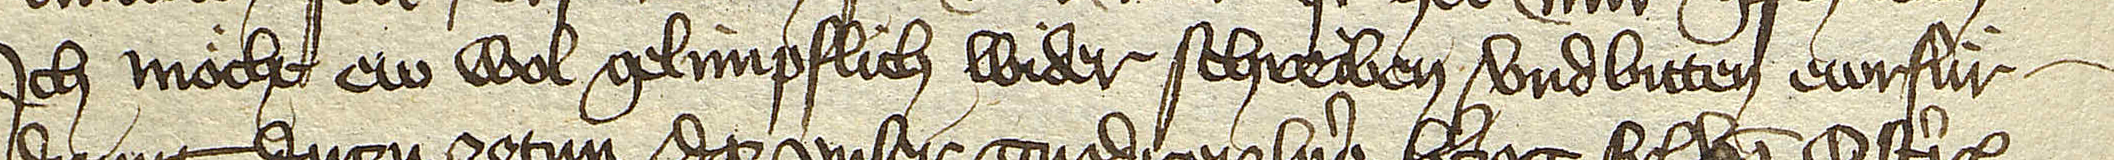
Ich möcht ew wol gelimpflich wider ſchreiben / vnd bitten ewr für -
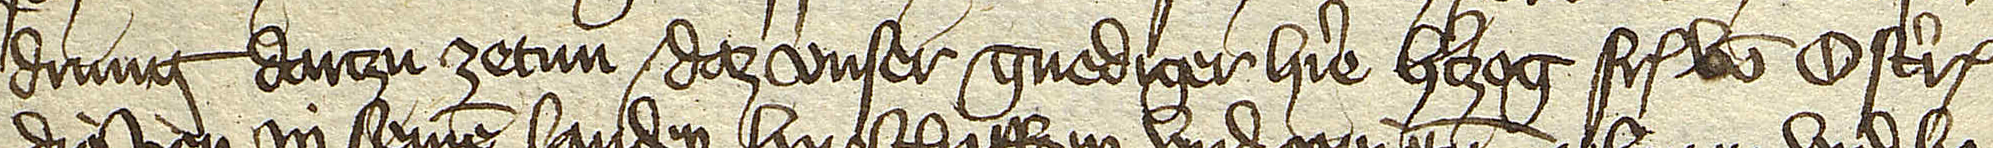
drung darcʒu cʒetun / daʒ vnſer gnediger hr*e h*cʒog fr* vo* Oſt*r*
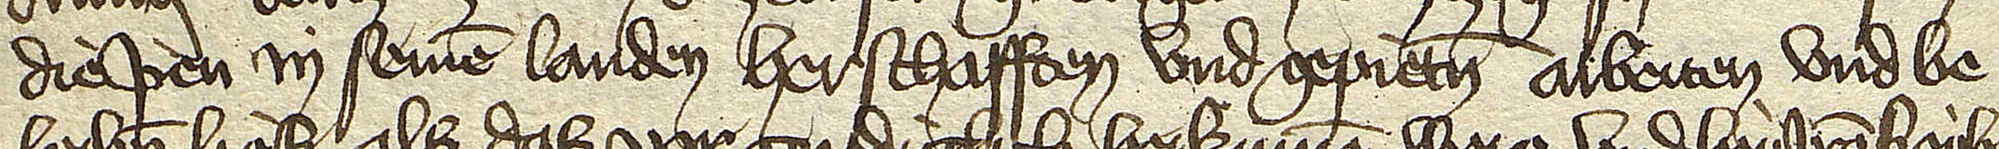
die Iren in ſeine* landen herſchafften vnd gepietn* arbeiten vnd be
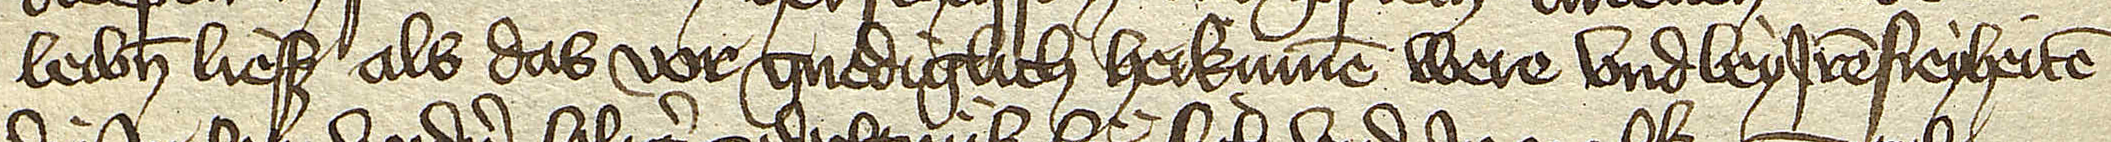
leibn* lieſʒ als das vor gnediglich herkume* were vnd bey Ire* freyheite*
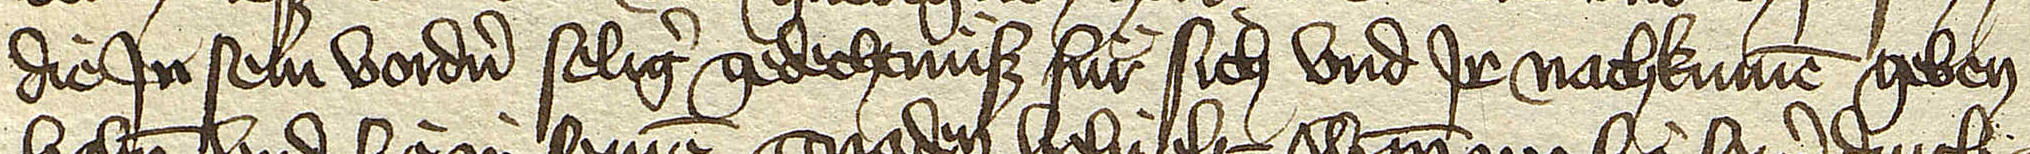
die In ſein vordn* ſelig* gedechtnüſʒ für ſich vnd Ir nachkume* geben
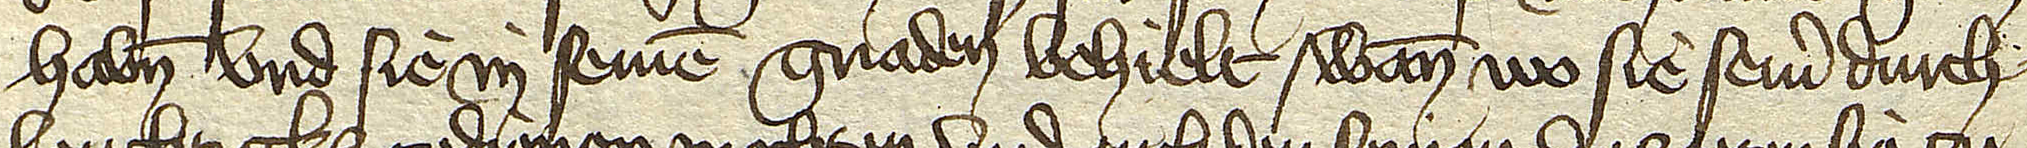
habn* vnd ſie in ſeine* gnaden behielt / wan* wo ſie ſein* durch
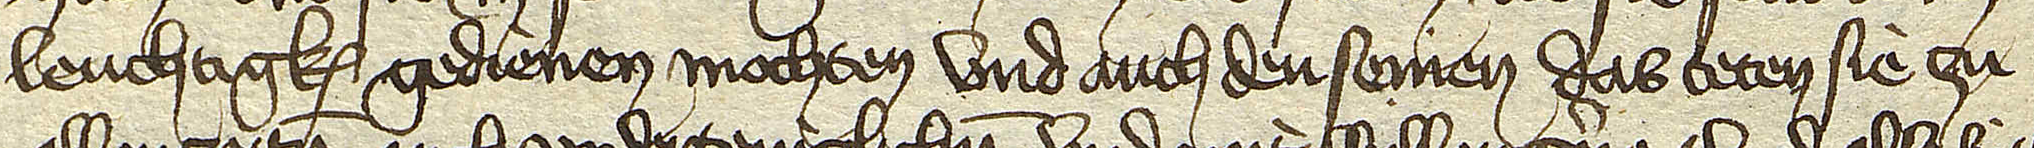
leuchtigk* gedienen mochten vnd auch den ſeinen das teten ſie cʒu
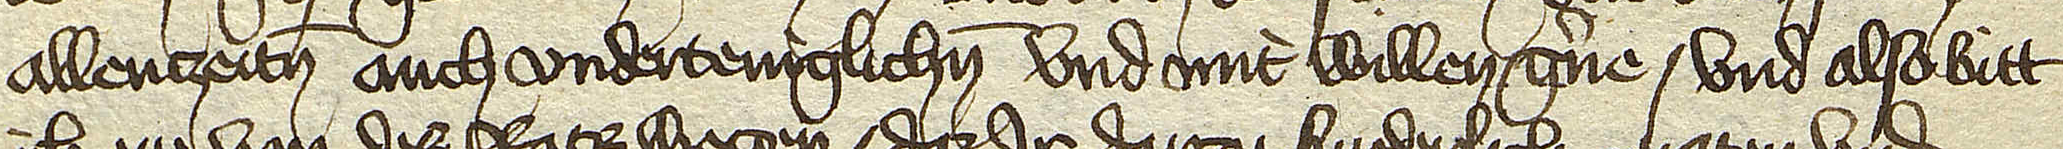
allencʒeitn* auch vnderteniglichn* vnd mit willen g*ne / vnd alſo bitt
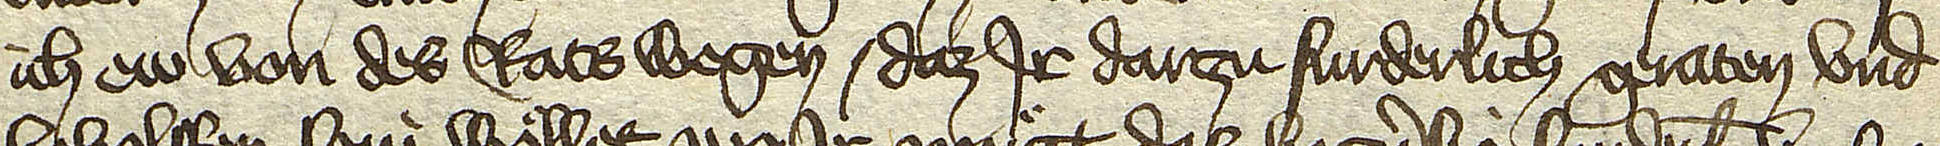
ich ew von des Rats wegen / daʒ Ir darcʒu furderlich geraten vnd
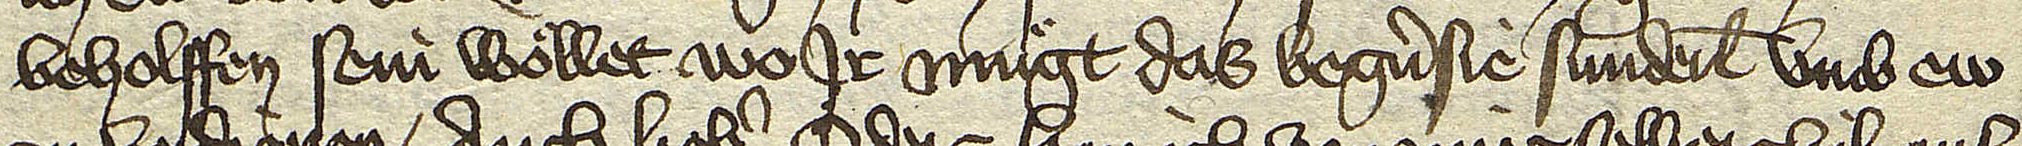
beholffen ſein wöllet wo Ir mügt das begn* ſie ſunderl* vmb ew
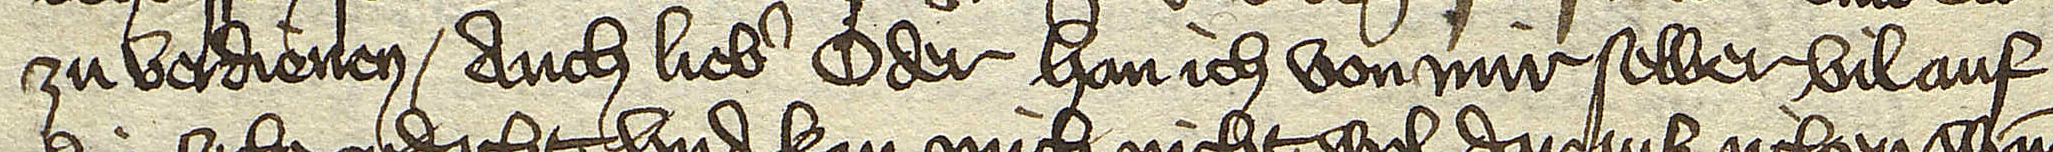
cʒu verdienen / Auch lieb* Oder han ich von mir ſelber vil auf
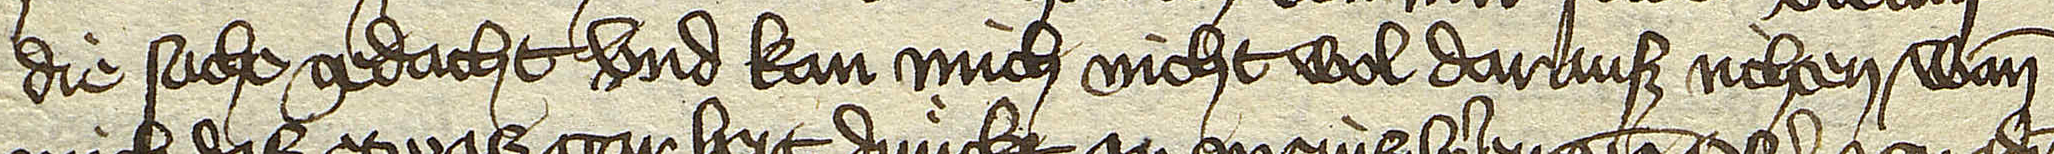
die ſache gedacht vnd kan mich nciht wol darauſʒ richten / wan*
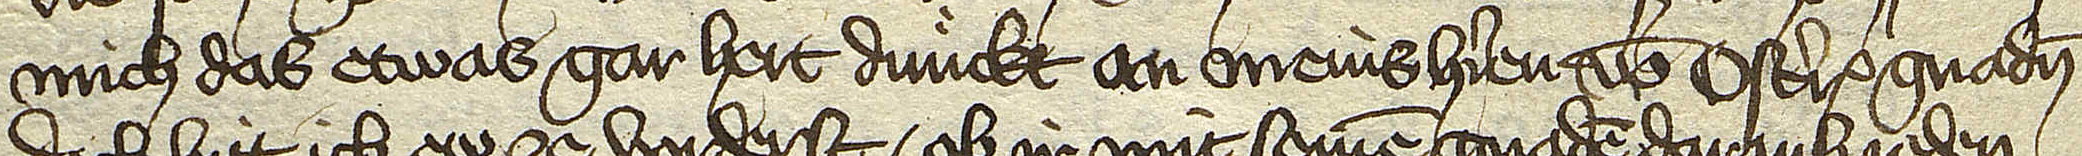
mich das etwas gar hert dünckt an meins hr*en vo* Oſt*r* gnadn*
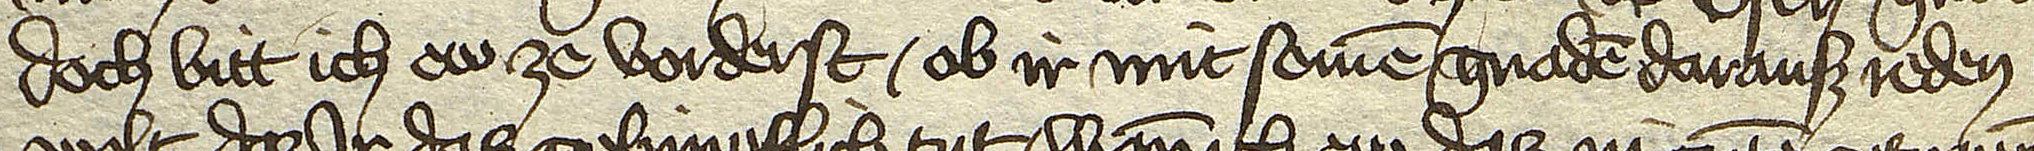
doch bitt ich ew cʒe vorderſt / ob ir mit ſeine* gnade* darauſʒ reden
